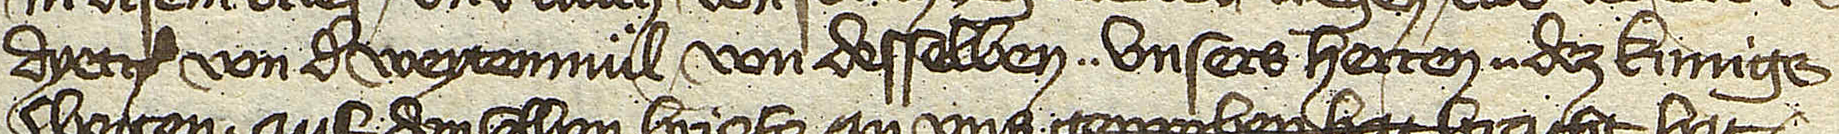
dyen* von d* weytenmül von deſſelben ~ vnſers herren ~ deʒ kunigs
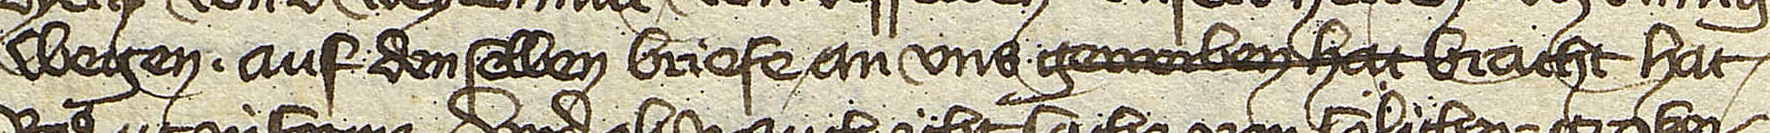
wegen . auf denſelben briefe / an vns gewerben hat bracht hat /
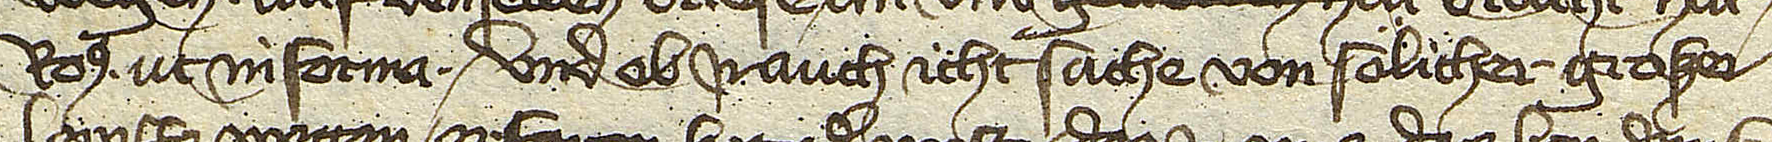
Ro* ut in forma . / Vnd ob Ir auch icht ſache von ſölicher groſʒer
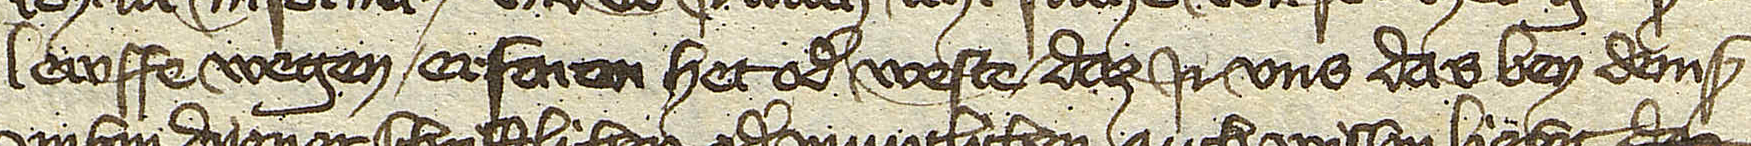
lewffe wegen / erfaren het od* weſte / daʒ Ir vns das bey demſ*
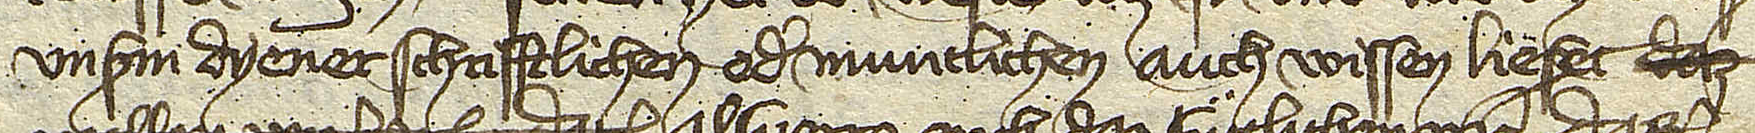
vnſ*m dyener ſchrifftlichen od* muntlichen auch wiſſen lieſʒet daʒ
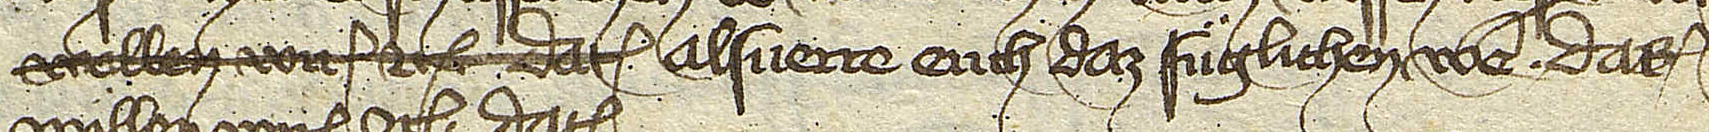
wollen wir* ec* dat* alſuerre euch daʒ füglichen we* . das*
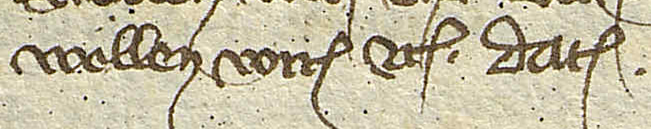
wöllen wir* ec*. dat* .
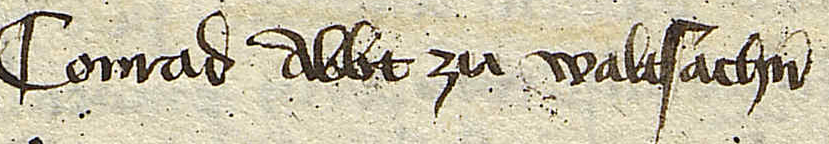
Conrad Abbt ʒu waltſachn*
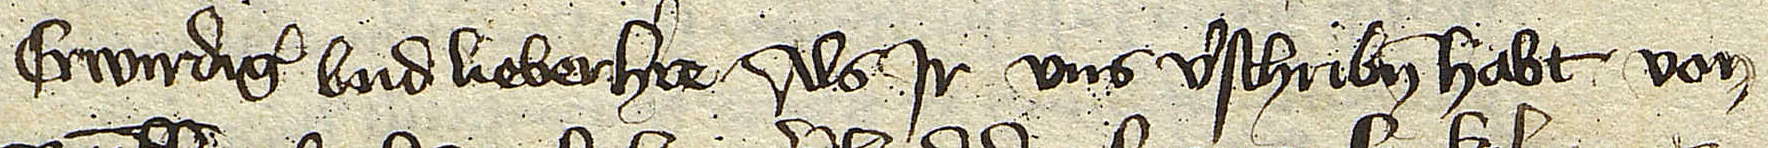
Erwirdig* vnd lieber h*re / Als Ir vns v*ſchribn* habt von
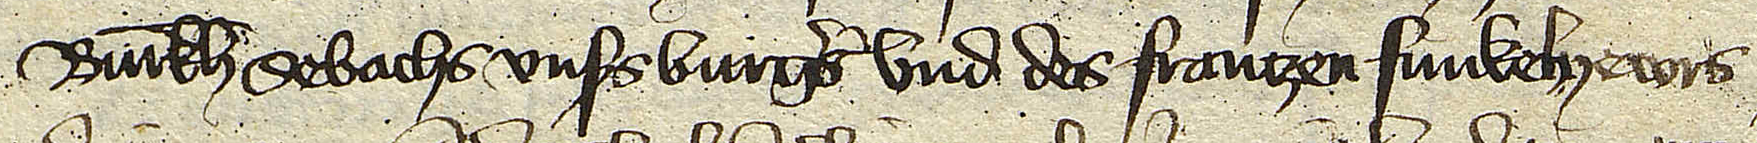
Burkh* Sebachs vnſ*s burg*s vnd des francʒen funkeln ewrs
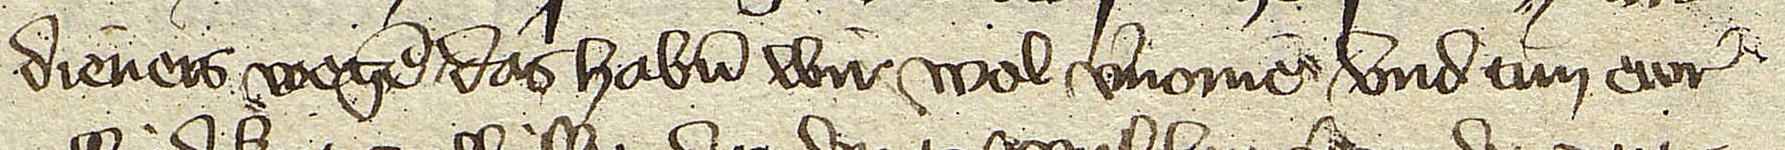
dieners wege* / das habn* wir wol v*nome* / vnd tun ewr*
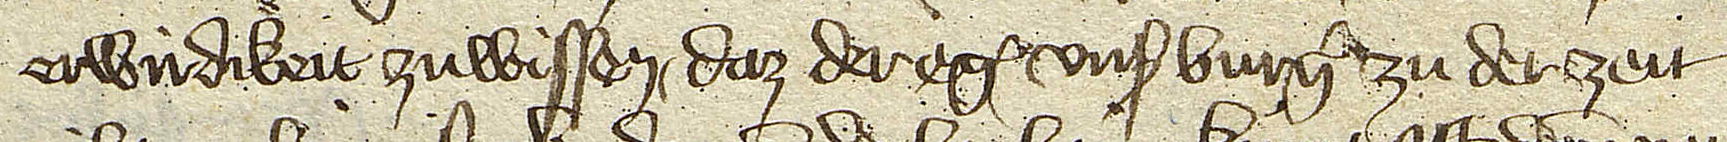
erwirdikeit cʒuwiſſen / daʒ der eg* vnſ* burg* cʒu der cʒeit
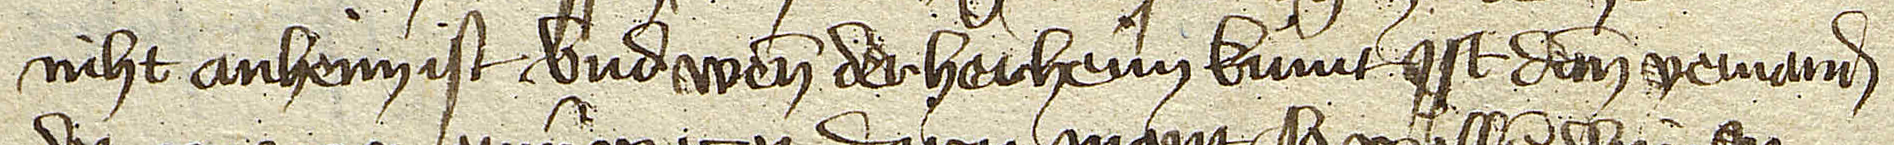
niht anheim iſt / vnd wen* der herheim kümt iſt dan* yemand*
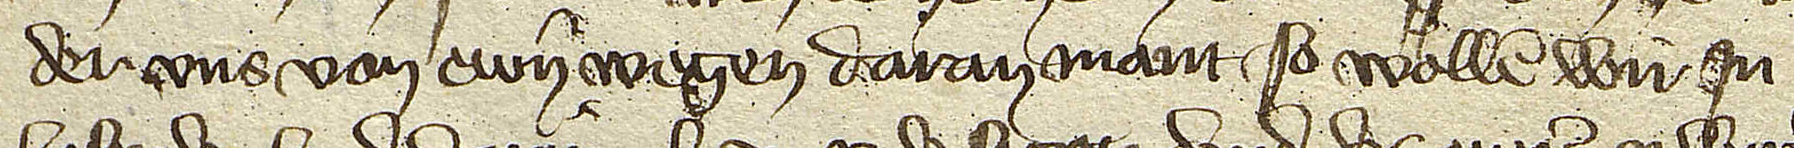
der vns von ewn* wegen daran mant / ſo wölle* wir In
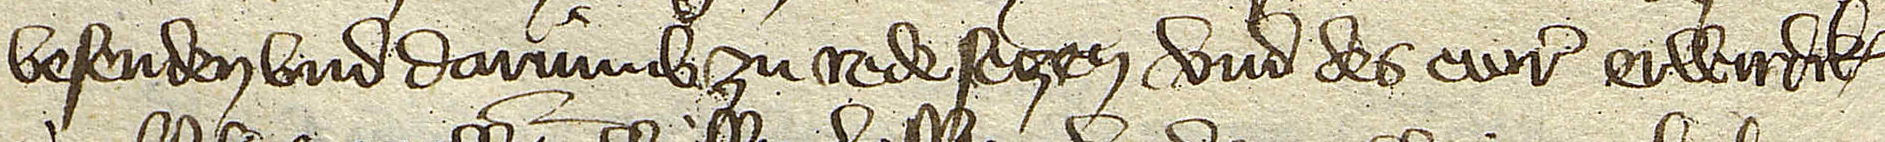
beſenden vnd darümb cʒu rede ſecʒen / vnd des ewr* erwirdik*
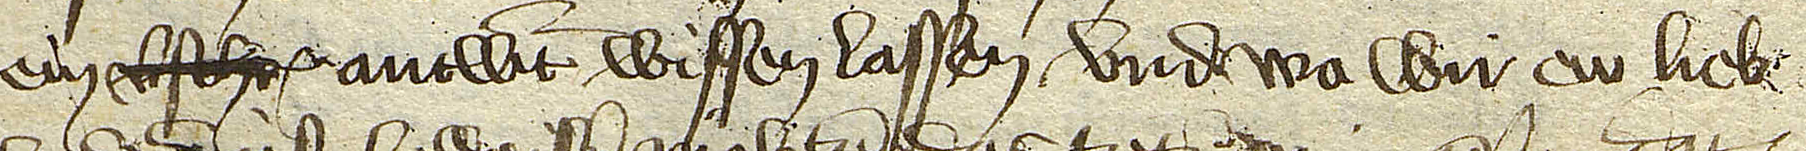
ein v*ſchr* antw*t wiſſen laſſen / vnd wo wir ew lieb
